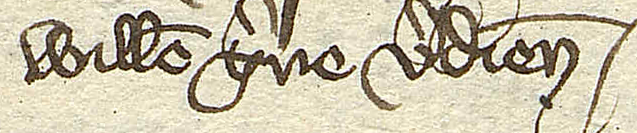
wille* g*ne v*dien* /
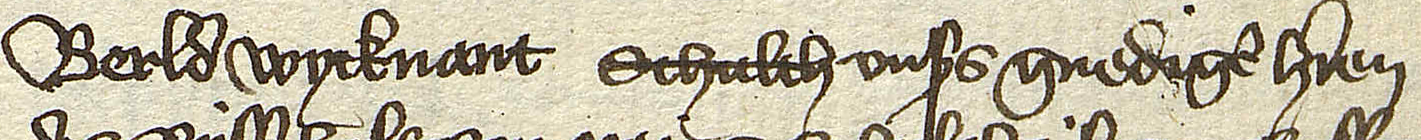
Berld wycknant Schulth vnſ*s gnedige* hr*en
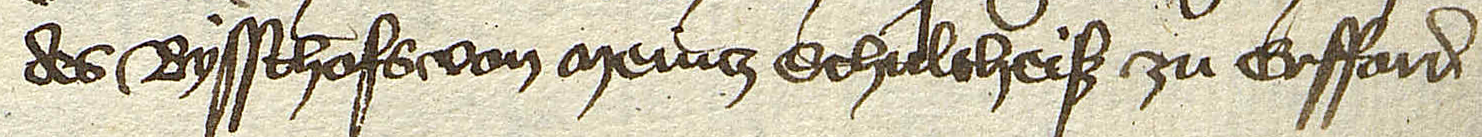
des Byſſchofs von Meincʒ Schultheiſʒ cʒu Erfford
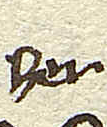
her
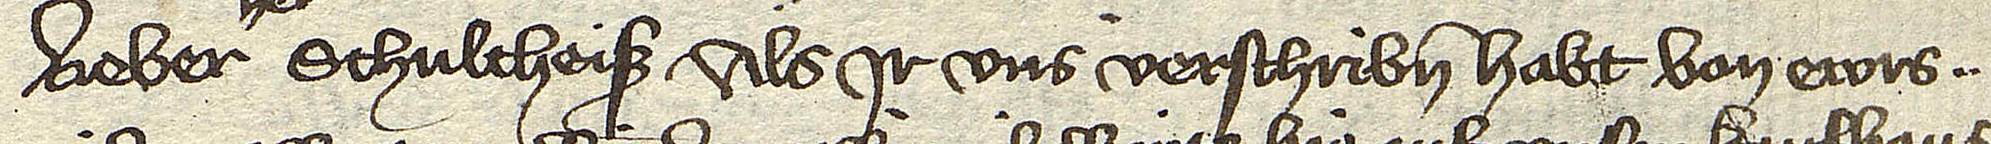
Lieber Schultheiſʒ / Als Ir vns verſchribn* habt von ewrs ~
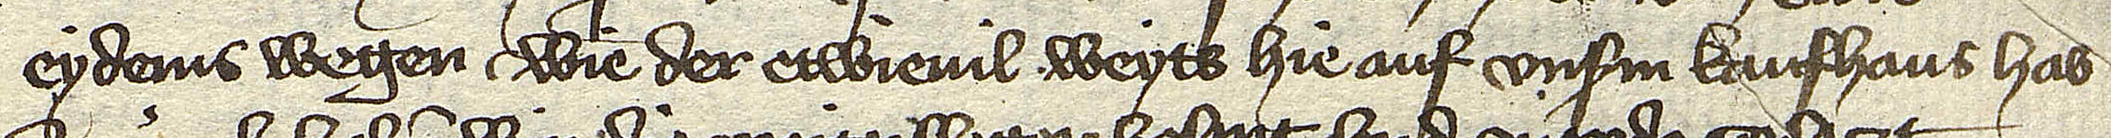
eydems wegen / wie der etwieuil weyts hie auf vnſ*m kaufhaus hab
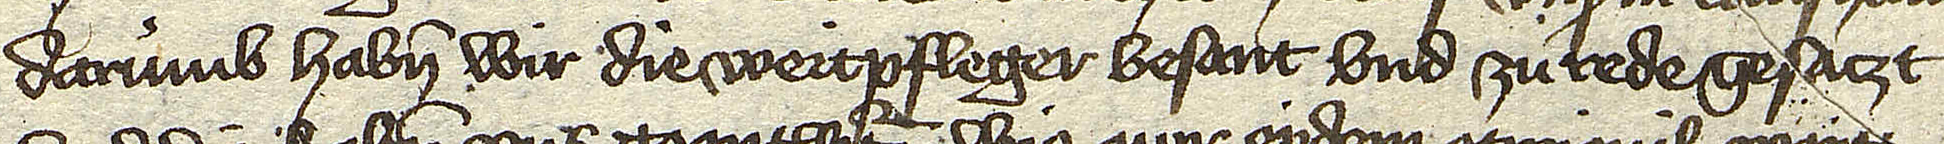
darümb habn* wir die weitpfleger beſant vnd cʒu rede geſacʒt
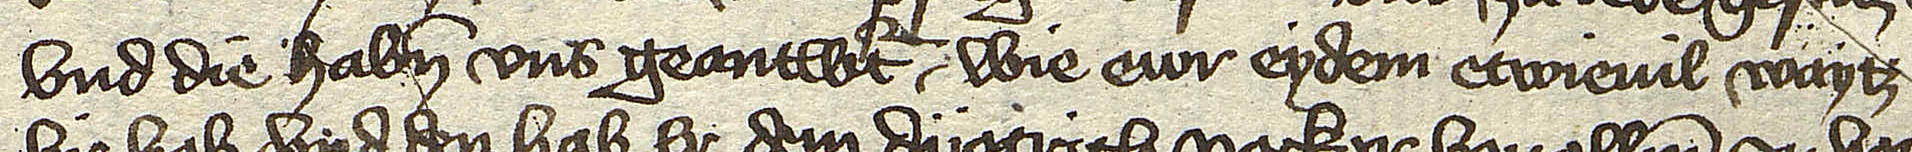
vnd die habn* vns geantwt* / wie ewr eydem etwieuil waycʒ
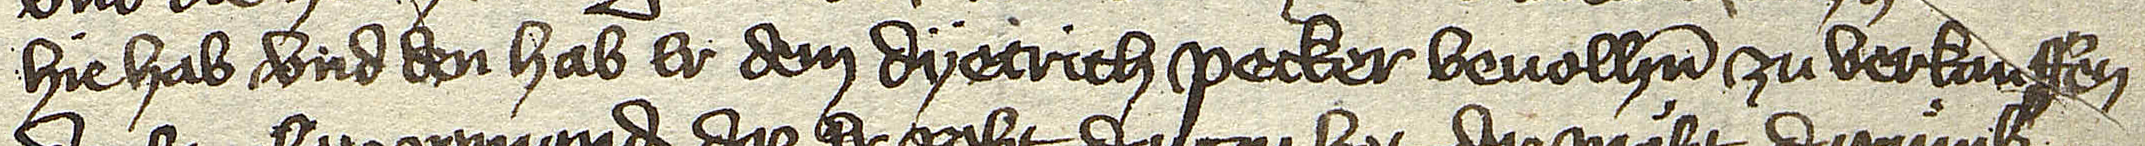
hie hab / vnd den hab Er dem Dyetrich pecker beuolhn* cʒu verkauffen
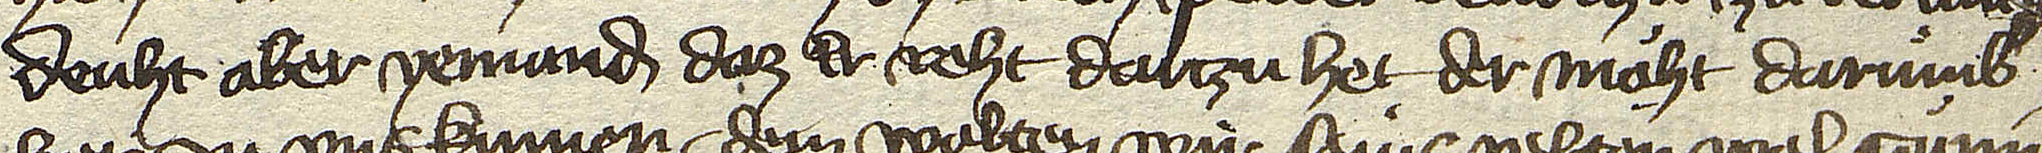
deuht aber yemand* daʒ Er reht darcʒu het der möht darümb
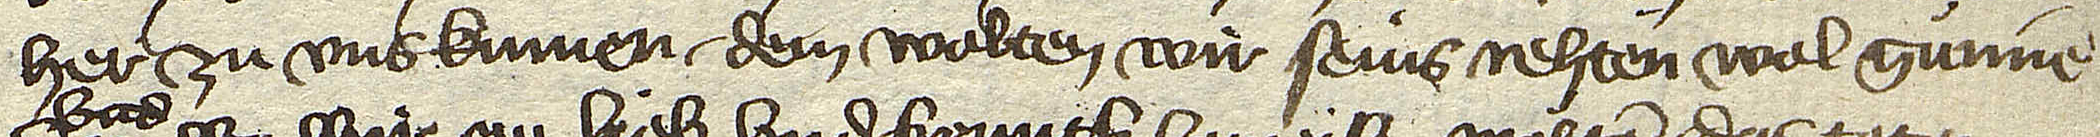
her cʒu vns kumen / dem wolten wir ſeins rehten wol günne*
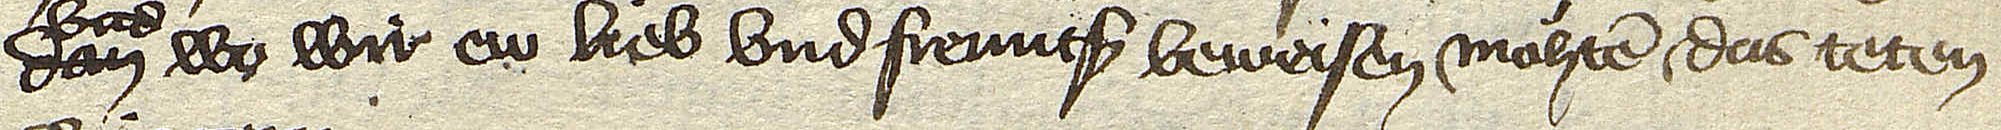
dan* wo wir ew lieb vnd freuntſ* beweiſen möhte* / das teten
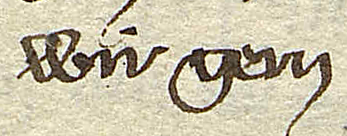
wir gern
